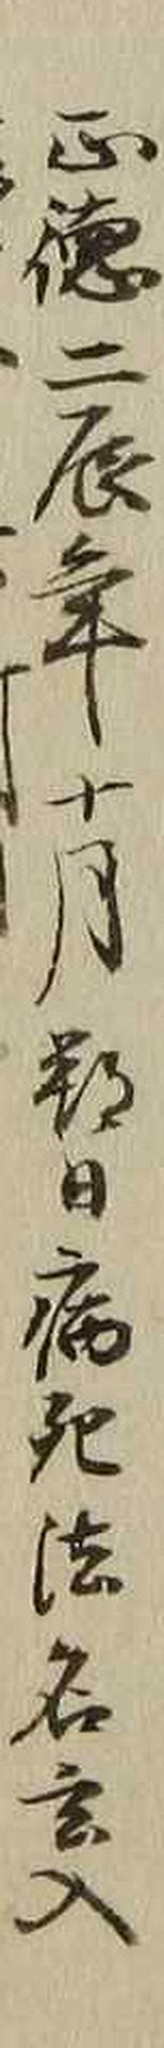権八正徳ニ辰年十月朔日病死法名玄入
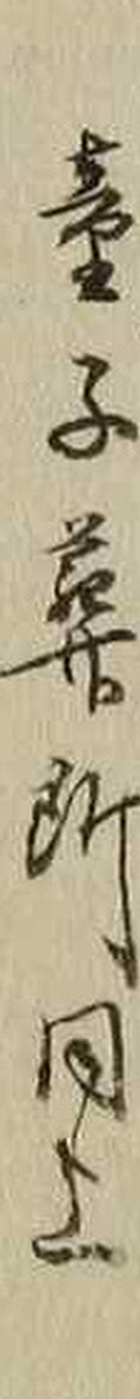童子葬所同上
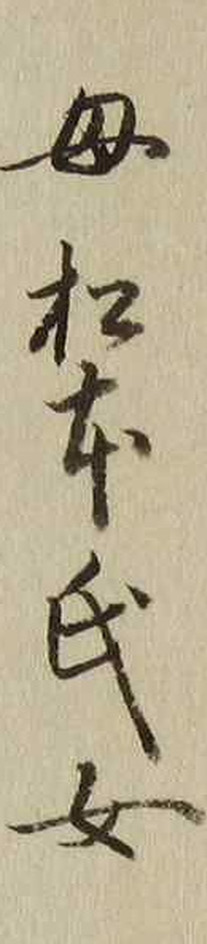母松本氏女
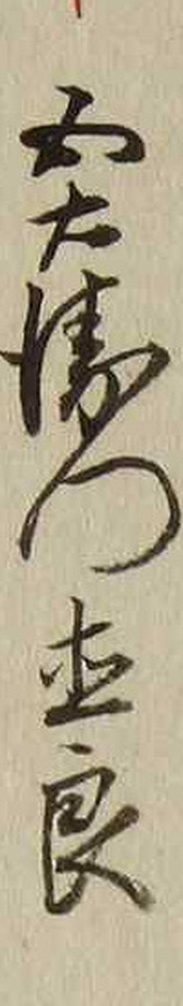五右衛門直良
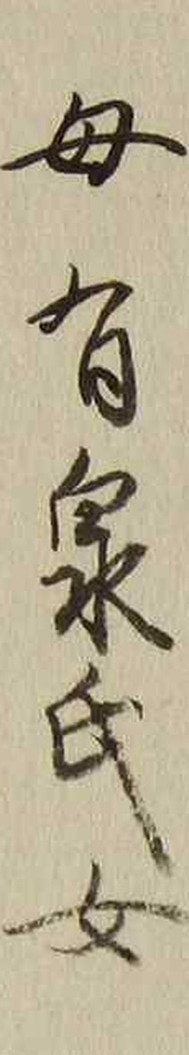母有泉氏女
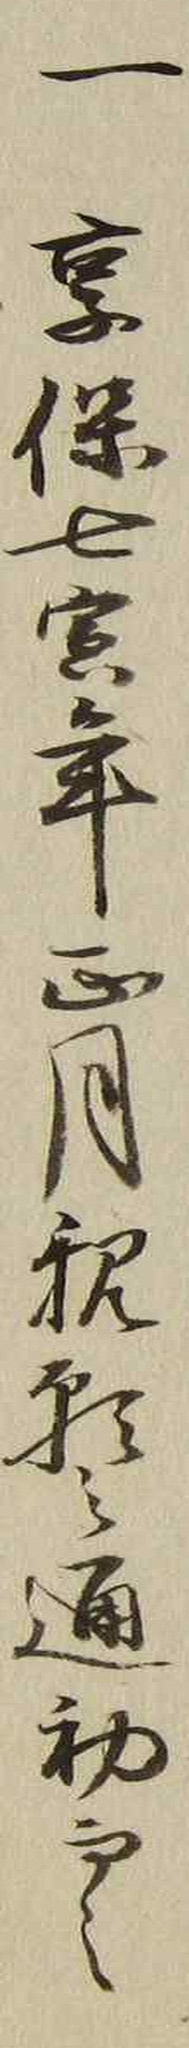一享保七寅年正月親願之通初而之
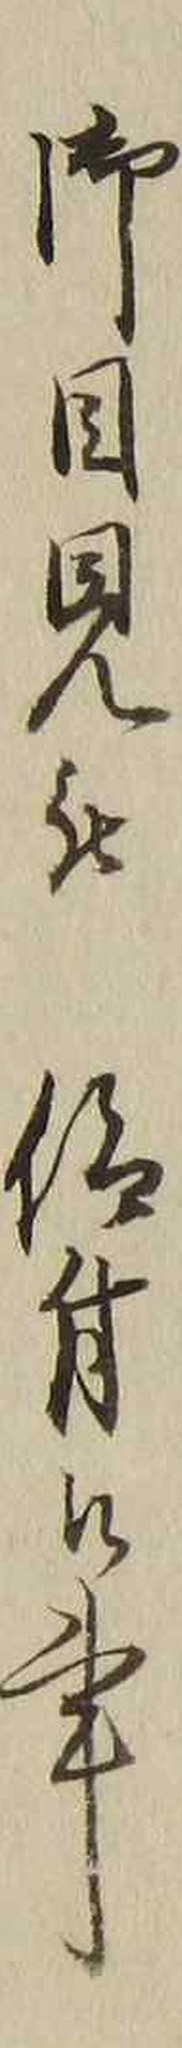御目見被仰付候事
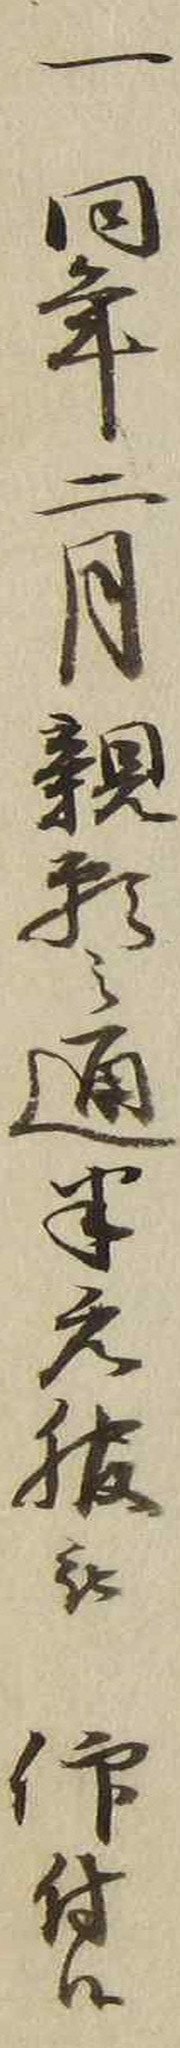一同年二月親願之通半元服被仰付候

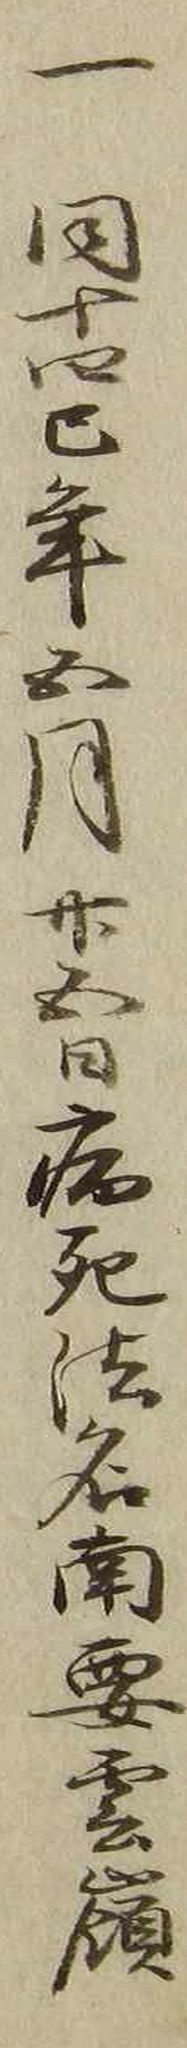一同十四巳年五月廿五日病死法名南要雲嶺
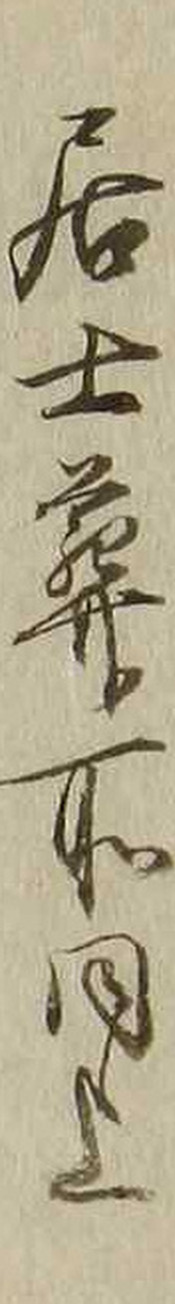居士葬所同上
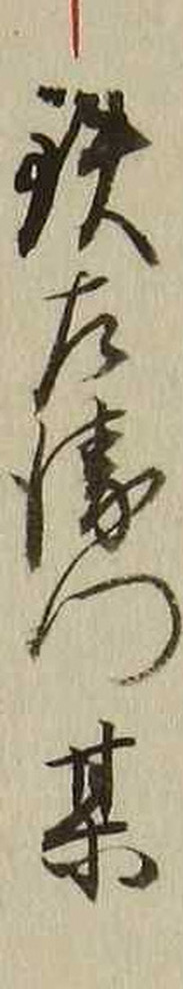鉄左衛門某
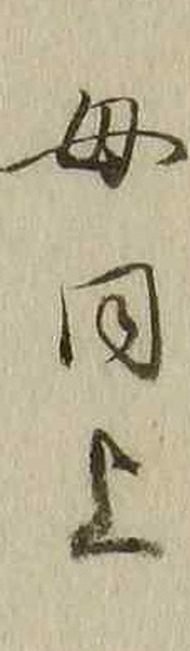母同上
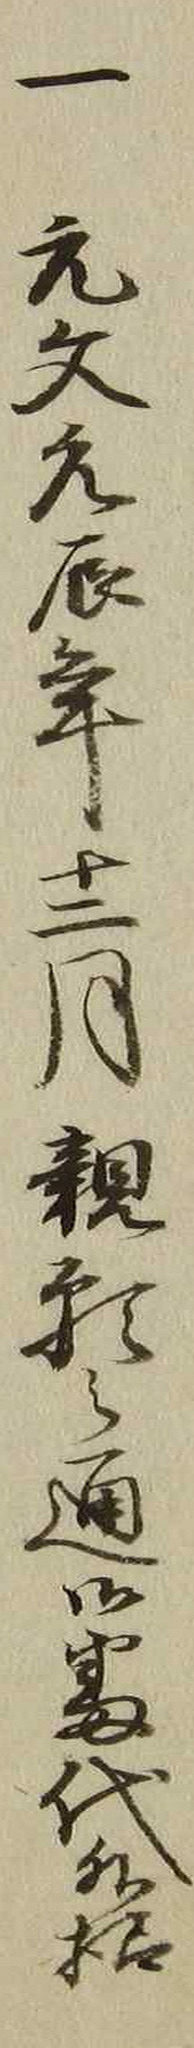一元文元辰年十二月親願之通御番代外様
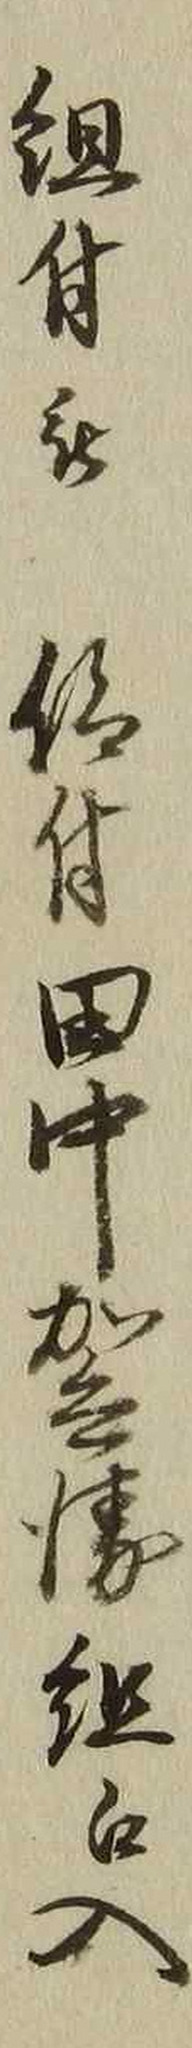組付被仰付田中加兵衛組江入
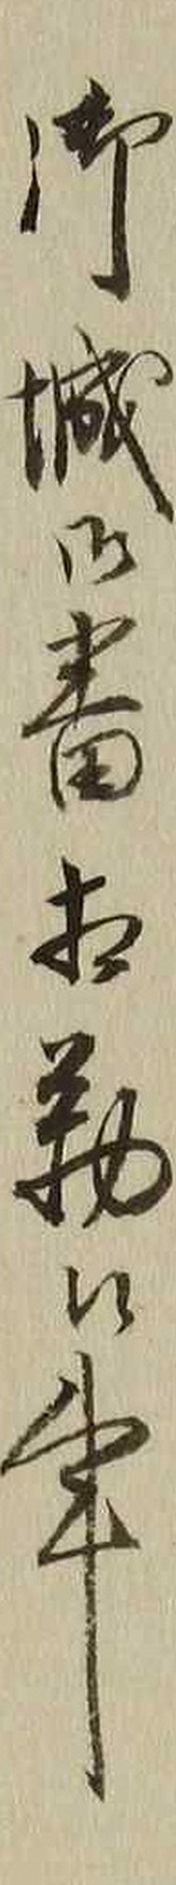御城御番相勤候事
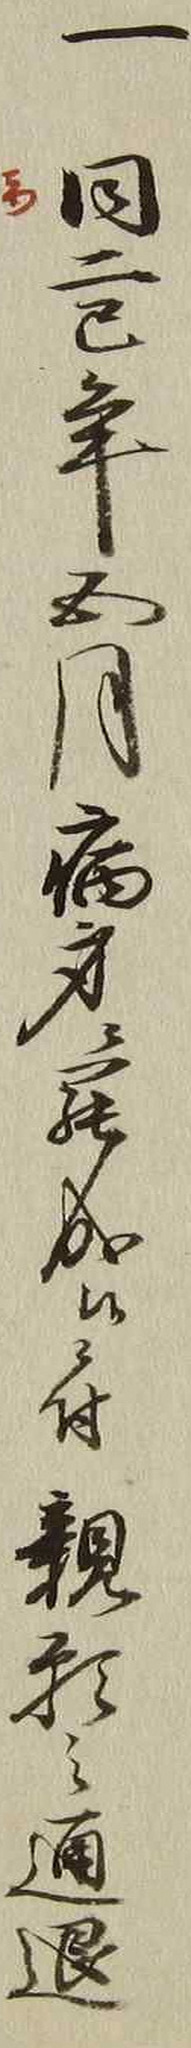一同ニ巳年五月病身ニ罷成候二付親願之通退
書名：諸士系譜　巻之114　か之部22
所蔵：会津若松市立会津図書館
